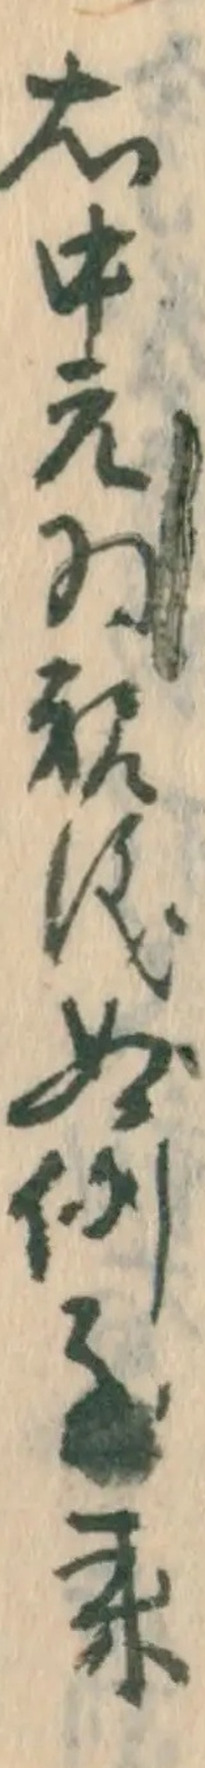右中元為祝儀如例到来

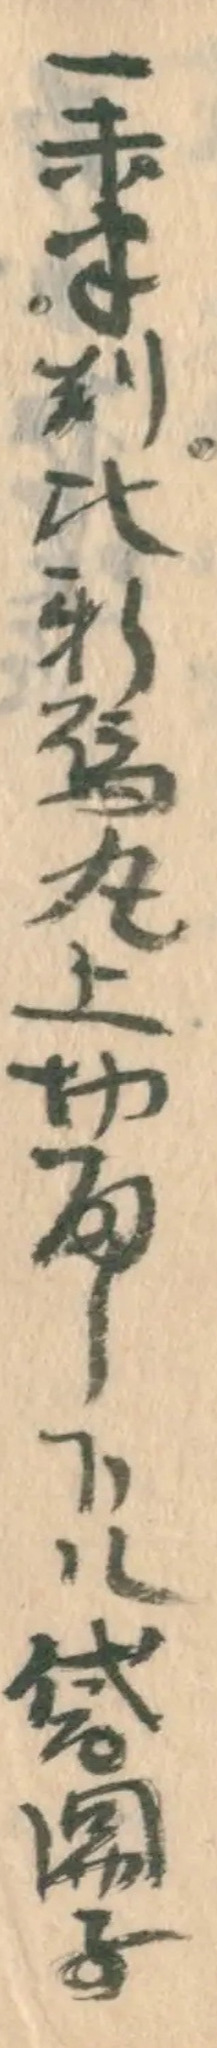一未半刻頃新烏丸上切通し下ル袋図子
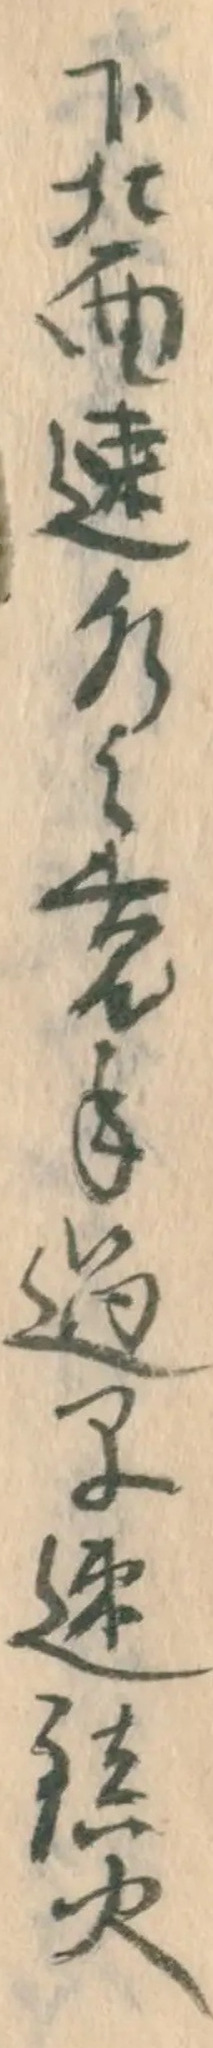下北面速水之裏手道早速鎮火
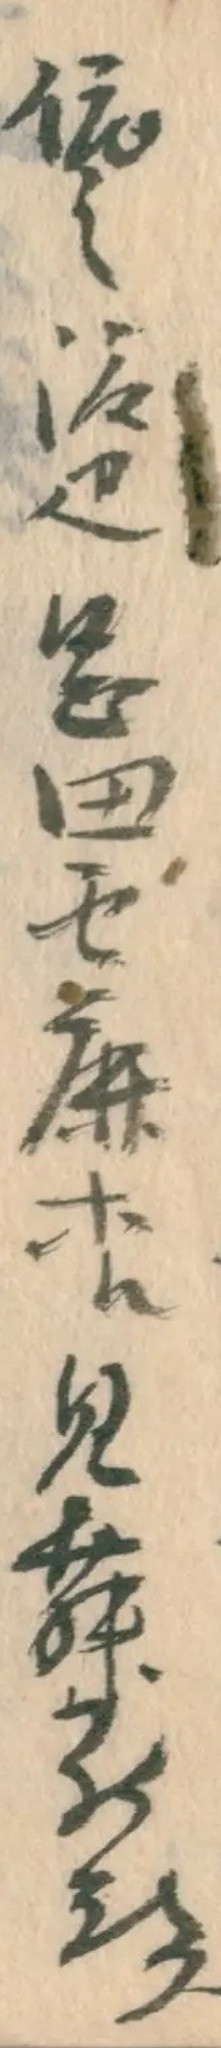依之渡辺岡田虫鹿等え見舞罷越ス
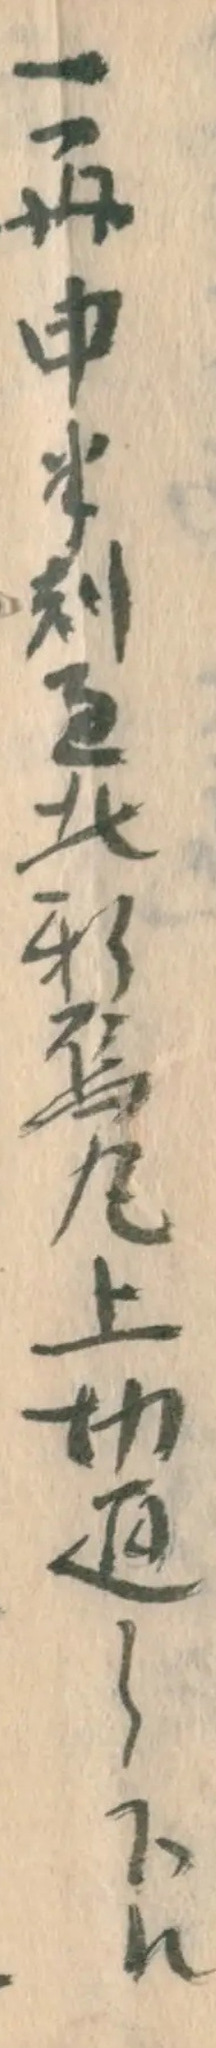一再申半刻過頃新烏丸上切通し下ル
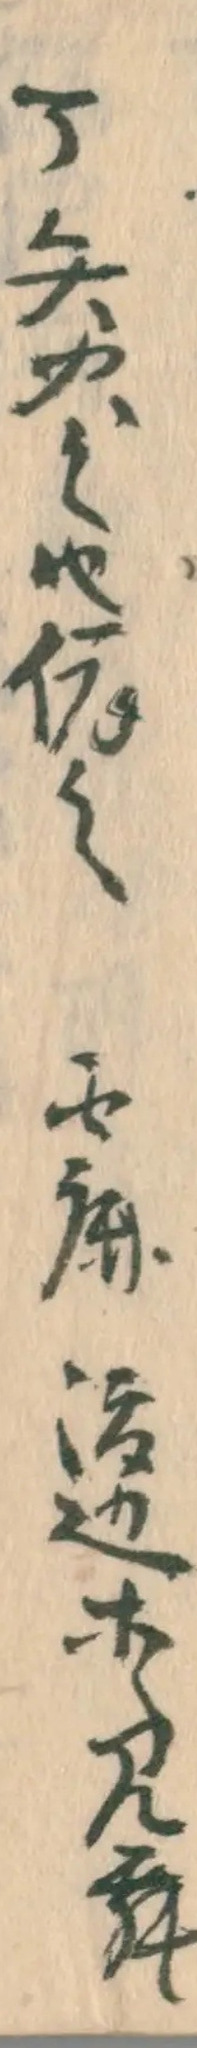丁失火之由依之虫鹿渡辺等へ見舞
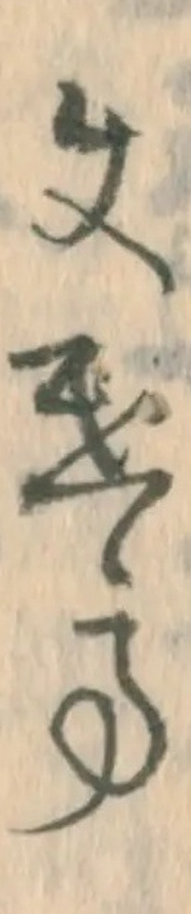使遣候事
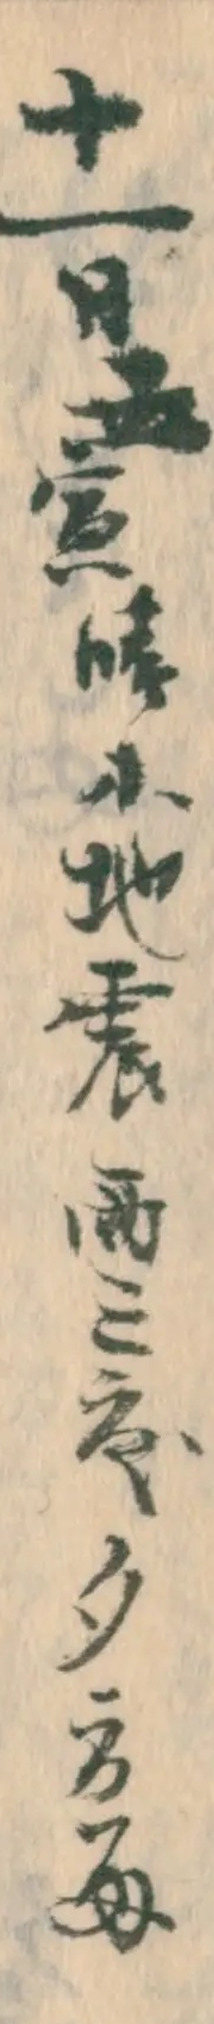十一日壬寅晴小地震両三度夕方雨
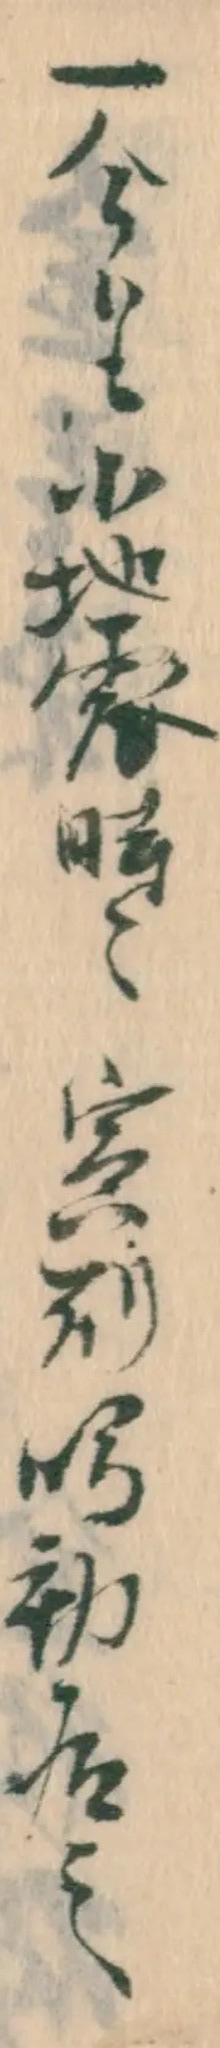一今日も小地震時々寅刻鳴動有之
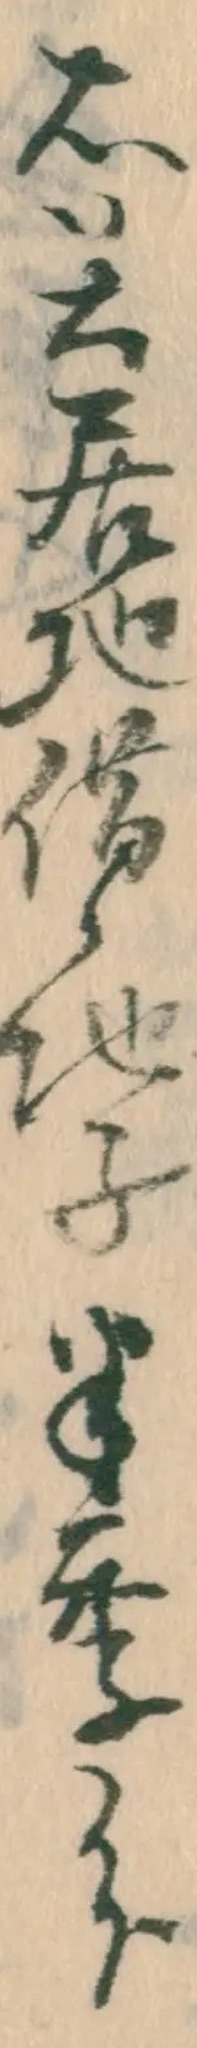右土居地借之地子半季分
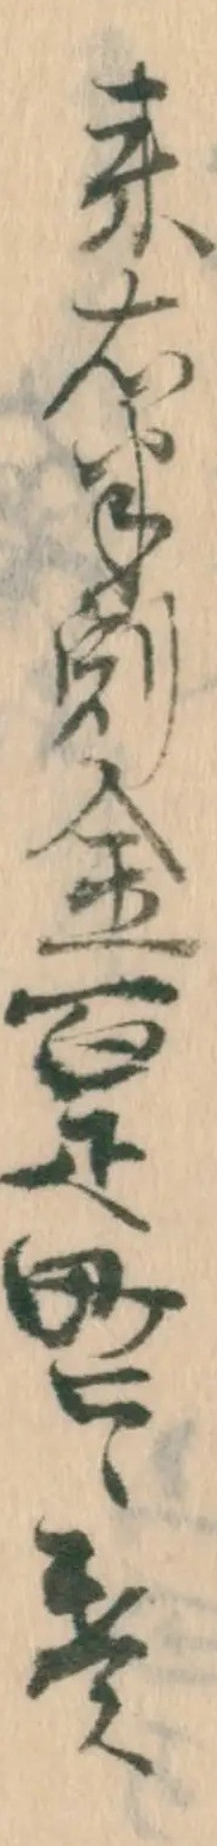来右半割金百疋町口へ遣ス
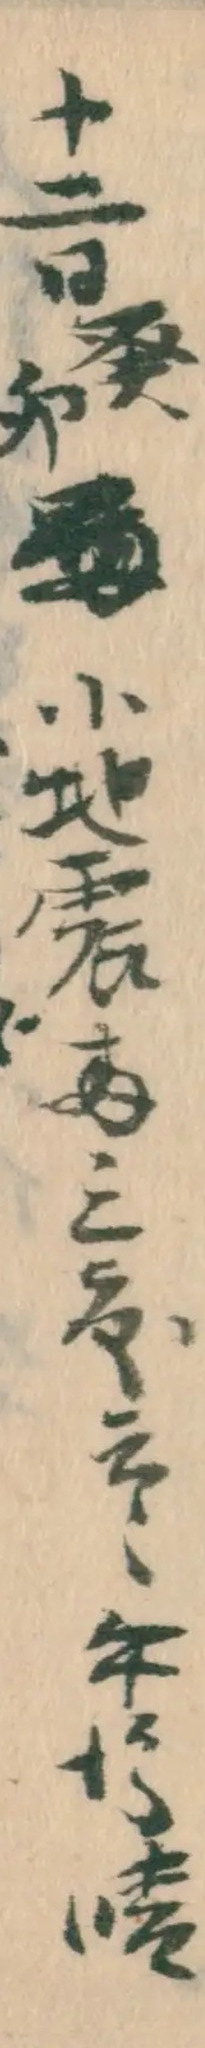十二日癸卯雨小地震両三度云々午後晴
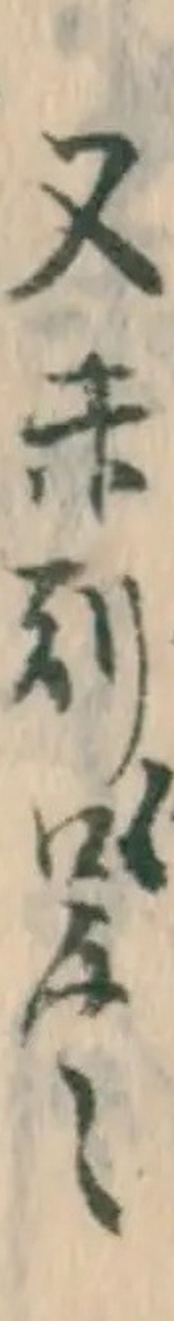又未刻ゟ度々
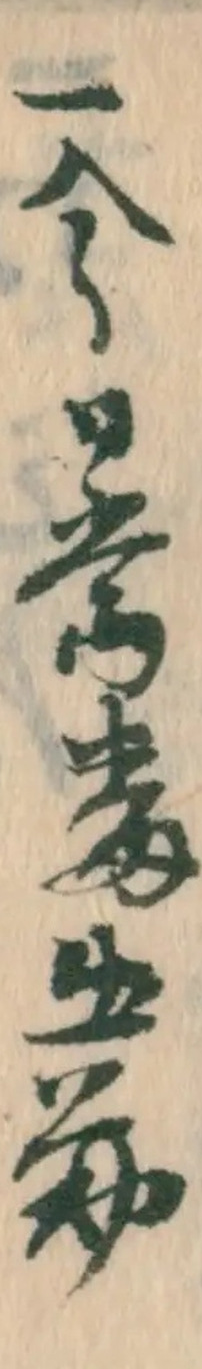一今日当番出勤
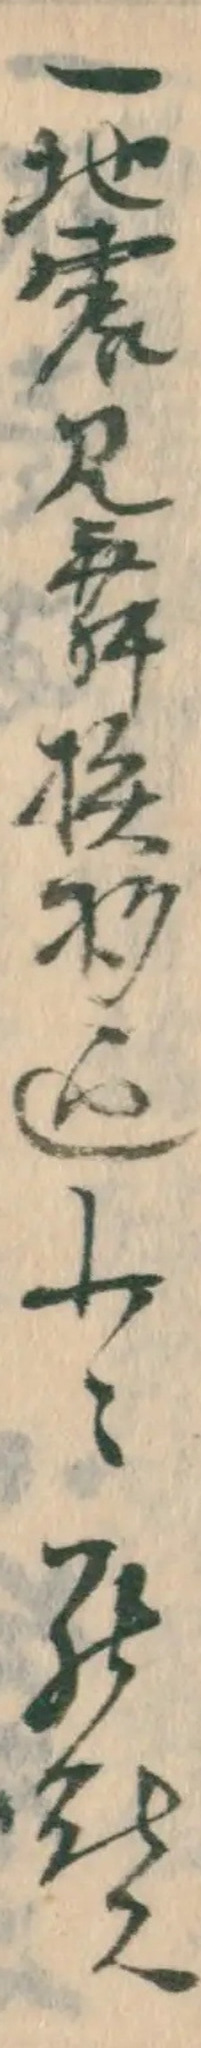一地震見舞挨拶廻少々罷越ス
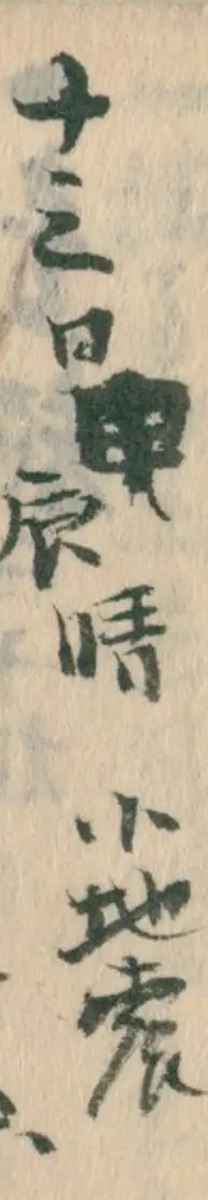十三日甲辰晴小地震
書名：禁裏御所御用日記. [131]
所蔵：国立国会図書館 National Diet Library, JAPAN
